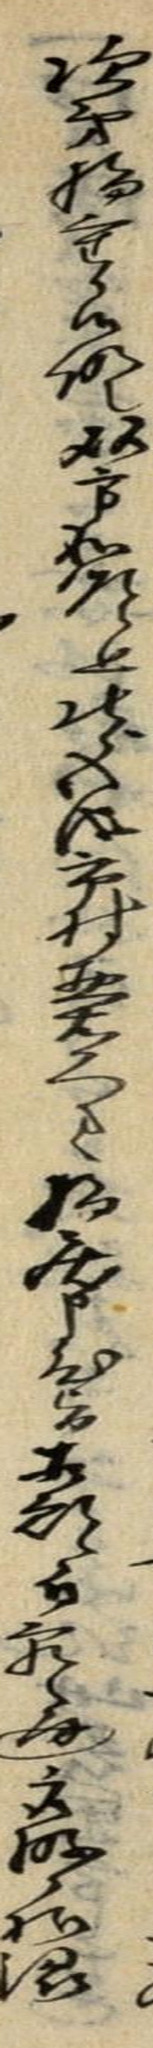次第指重候仍之双方和順之上次郎八儀市村惣右衛門方へ指戻申度旨相願候ニ付願之通取扱候様渋
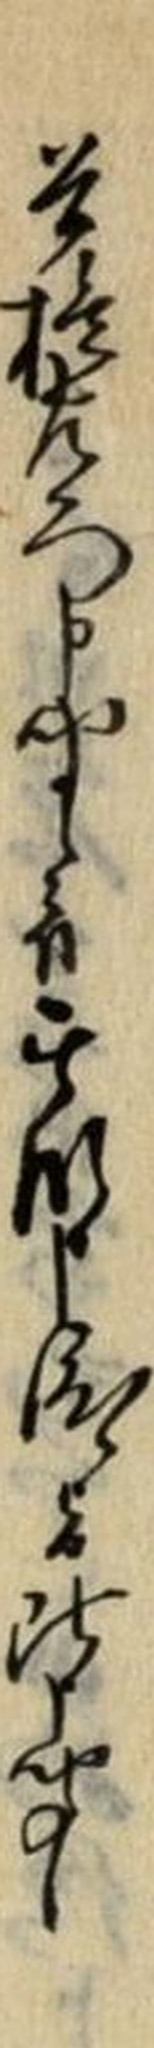谷権左衛門申聞候ニ付其段申渡候旨断申聞候
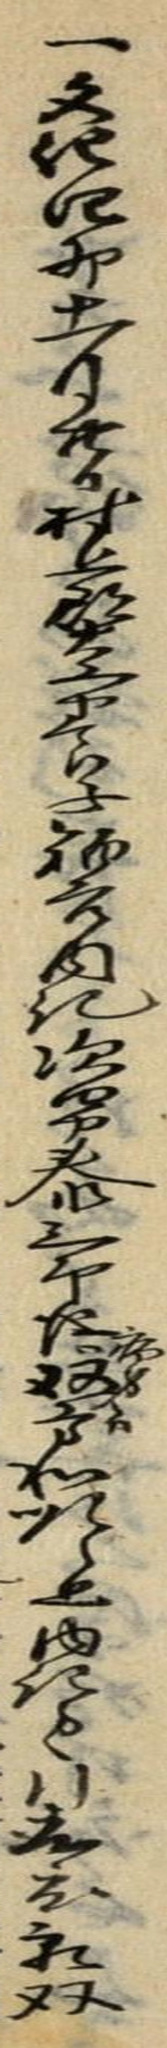一文化四卯十一月廿日村上郡太夫養子柏谷内記次男泰三郎儀◦病身ニ付双方和順之上内記方へ引取度願双
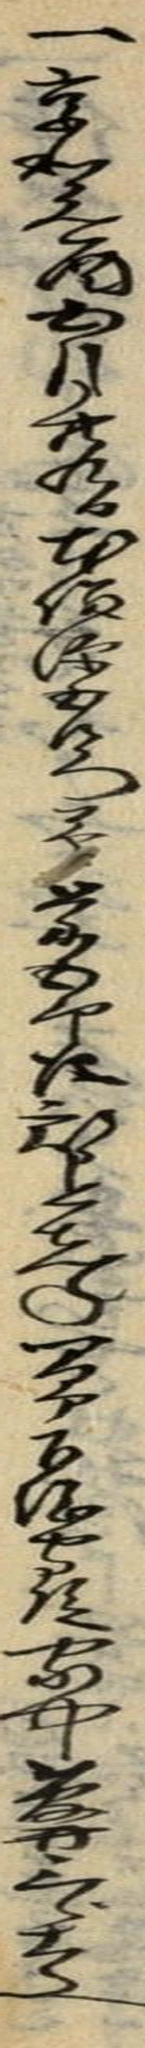一享和元酉五月廿九日本儀源五左衛門弟栄五郎儀願申上先年間部下総守殿家中菅井三郎大夫
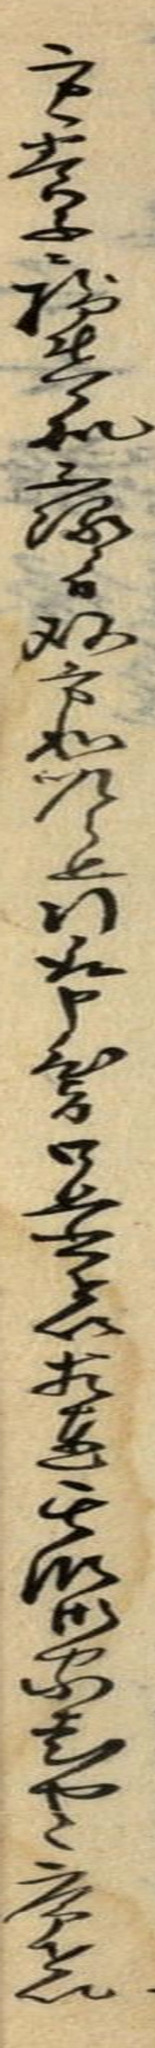方へ養子ニ指遣候処不縁ニ付双方和順之上引取申度旨口上書を以相達其段御家老中へ序を以
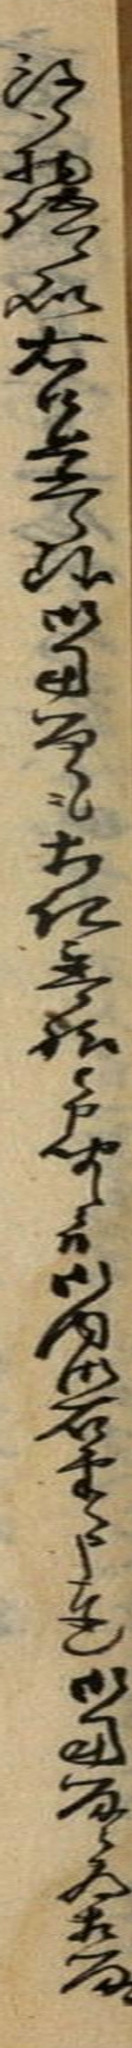致御物語候処右口上書之趣御用留へも相記置候様被申聞ニ付御内御右筆へ申達御用留へ為相留候
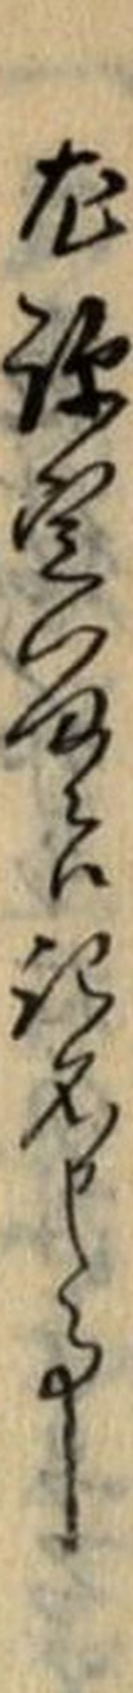尤評定留ニハ記不申候事
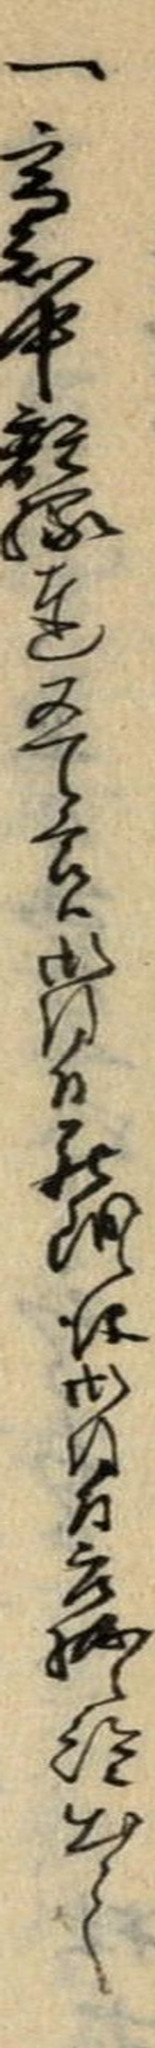一高知中離縁達有之節ハ御目付罷越候儀御目付取扱候之部出之
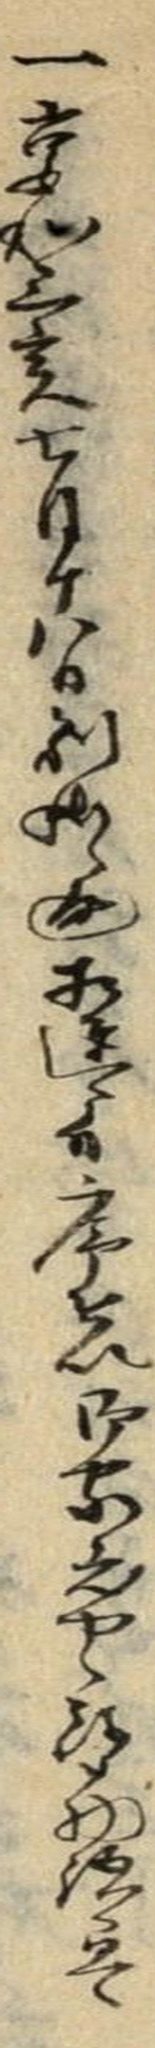一享和三亥七月十八日別紙之通相達候ニ付序を以て御家老中へ致御物語置候
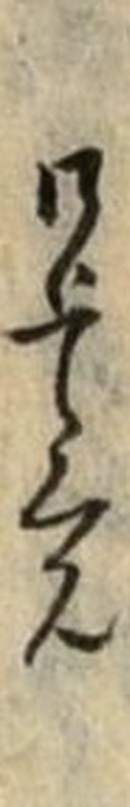口上之覚
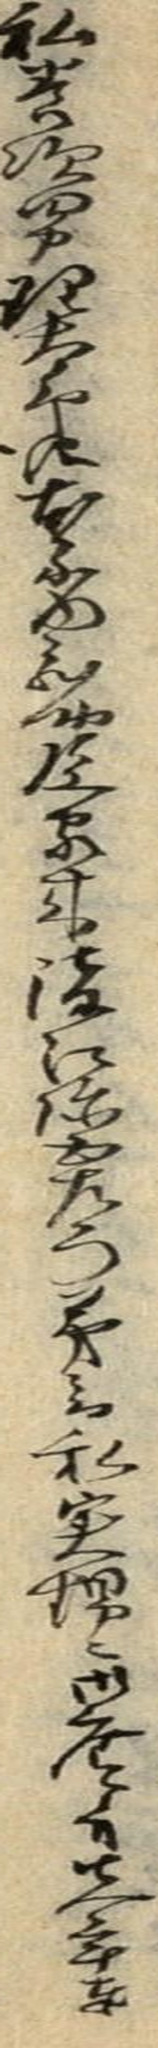私養次男理太郎儀本多内蔵助殿家来溝江弥五左衛門弟ニ而私実甥二御座候ニ付先年奉
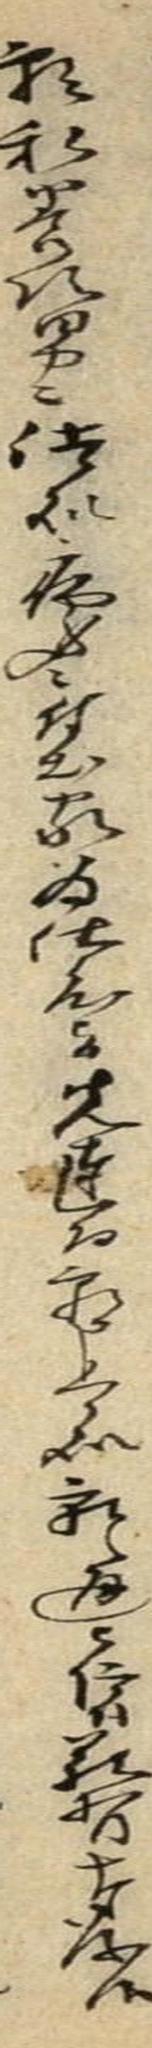願私養次男ニ仕候処病身ニ付出家為仕度旨先達而願申上候処願之通被仰付難有奉存候
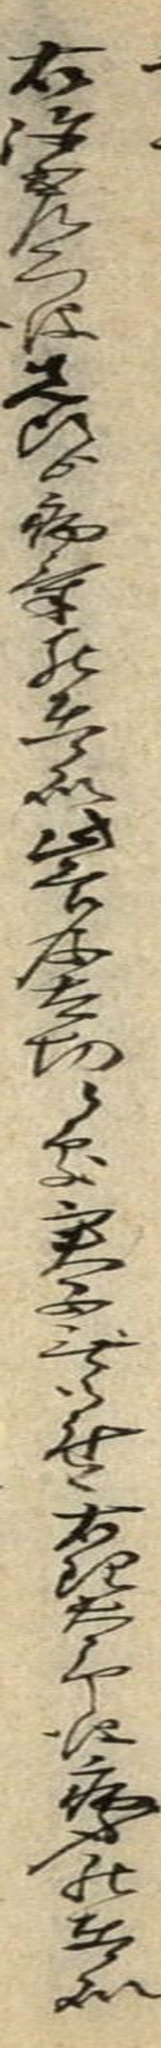右弥五左衛門儀先頃ゟ病気罷在候処此節及太切候処実子無御座候右理太郎儀病身罷在候処
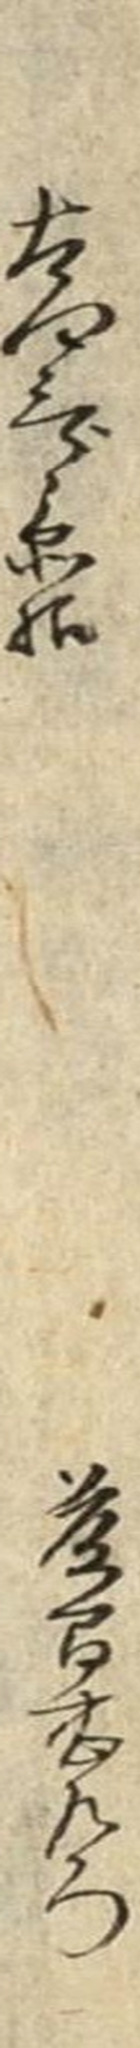七月太田三郎兵衛様藤間甚左衛門
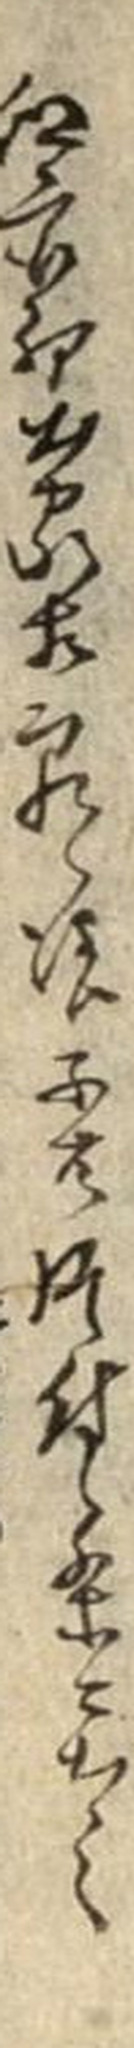但最初出家相願候儀ハ子共片付之条ニ出之
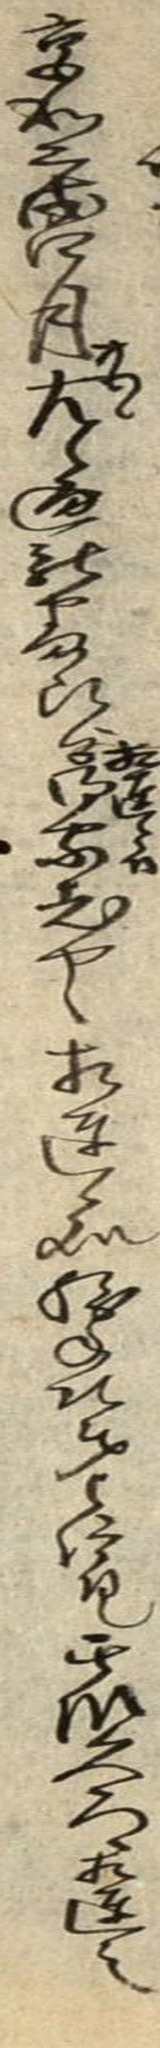一享和二戌四月廿五日左之通新番頭ゟ相達候ニ付◦御家老中へ相達候処勝手次第被仰付候其段久右衛門へ相達之
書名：養子縁組之部
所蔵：福井県文書館 Fukui Prefectural Archives
